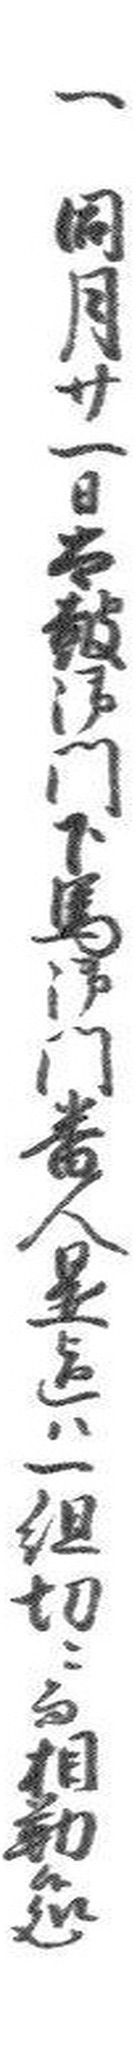一同月廿一日太鼓御門下馬御門番人是迄ハ一組切ニ而相勤候処
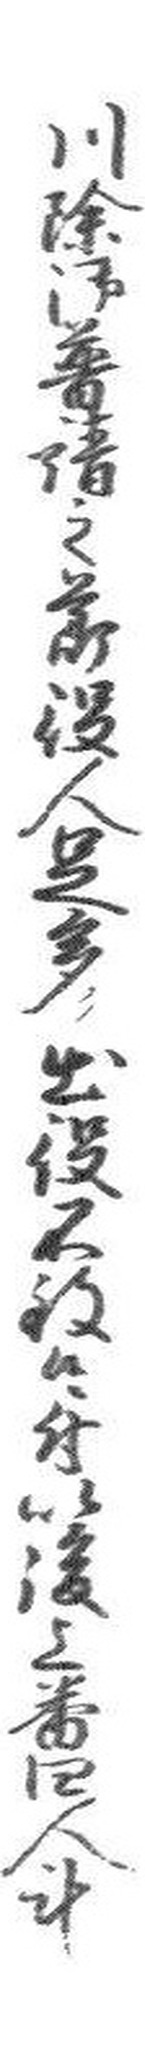川除御普請之節役人足多ク出役不致候ニ付以後上番四人計
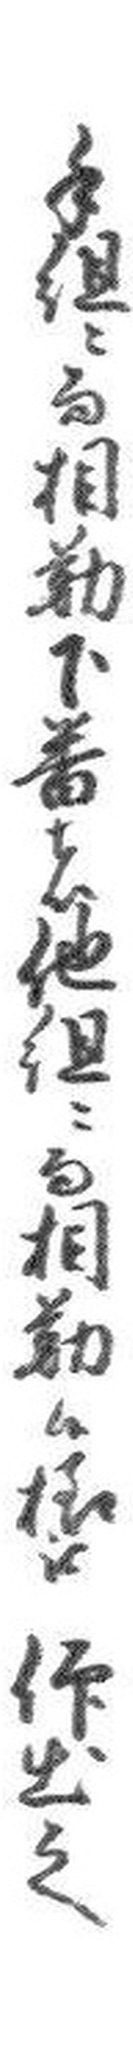手組ニ而相勤下番者他組ニ而相勤候様被仰出之
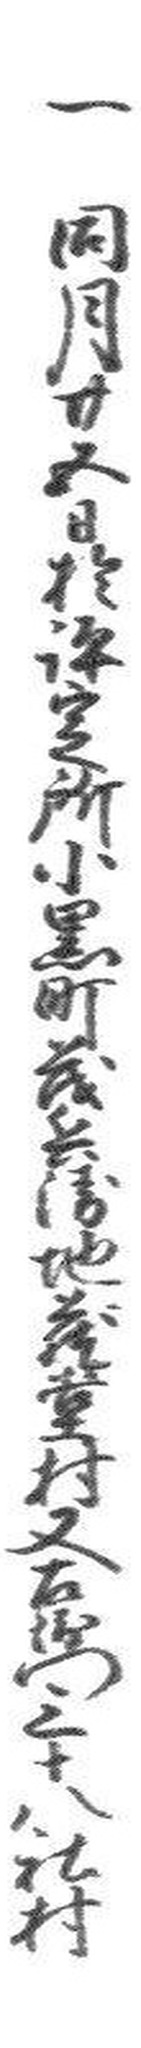一同月廿五日於評定所小黒町茂兵衛地蔵堂村又右衛門三十八社村
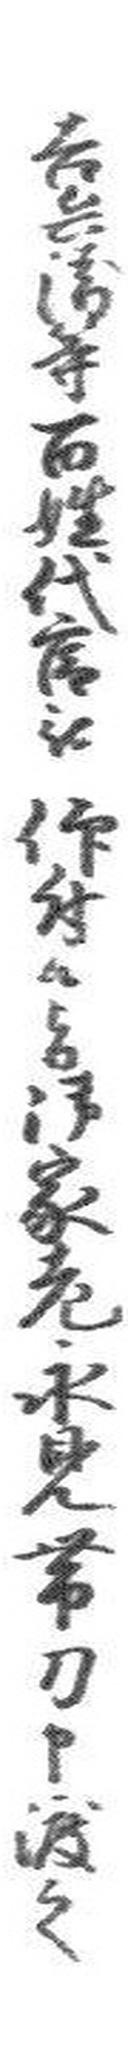吉兵衛等百姓代官被仰付候旨御家老永見帯刀申渡之
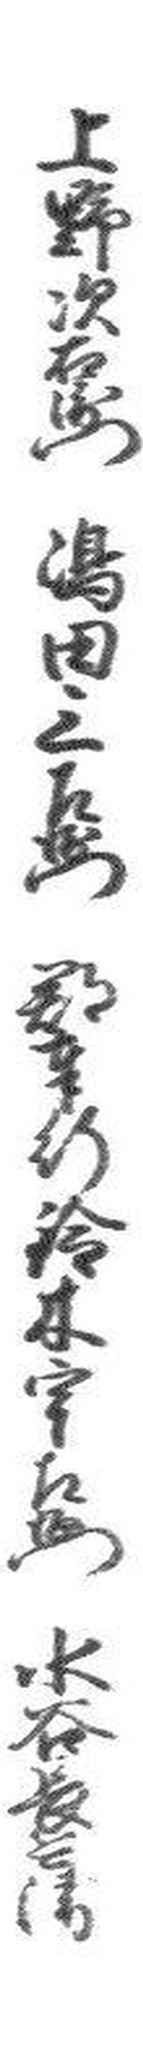上野次右衛門嶋田三左衛門郡奉行鈴木宇左衛門水谷長兵衛
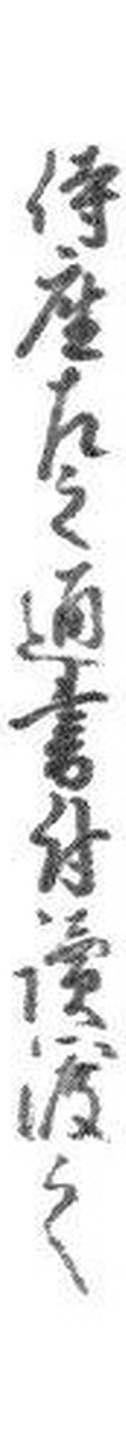侍座左之通書付読渡之
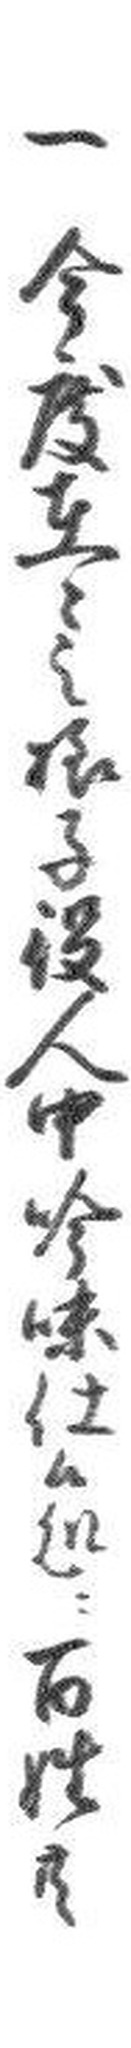一今度在々之様子役人中吟味仕候処ニ百姓共
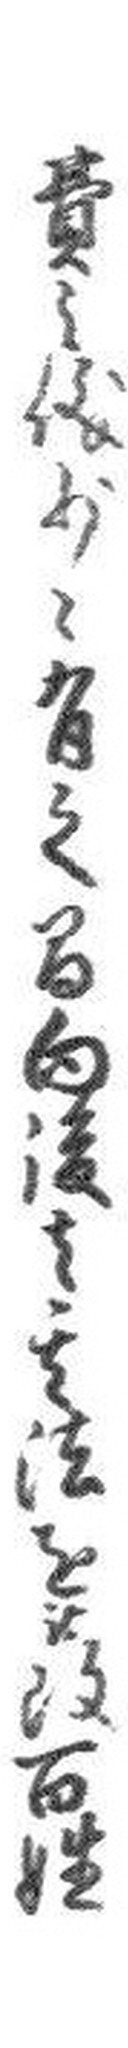費之儀少々有之間向後者其法を改百姓

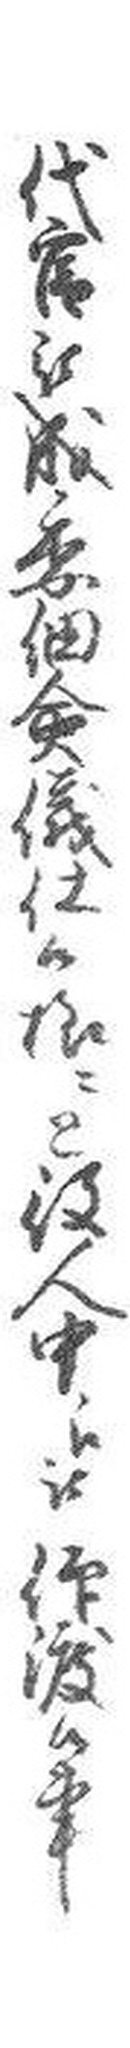代官被成委細僉儀仕候様ニと役人中江被仰渡候事
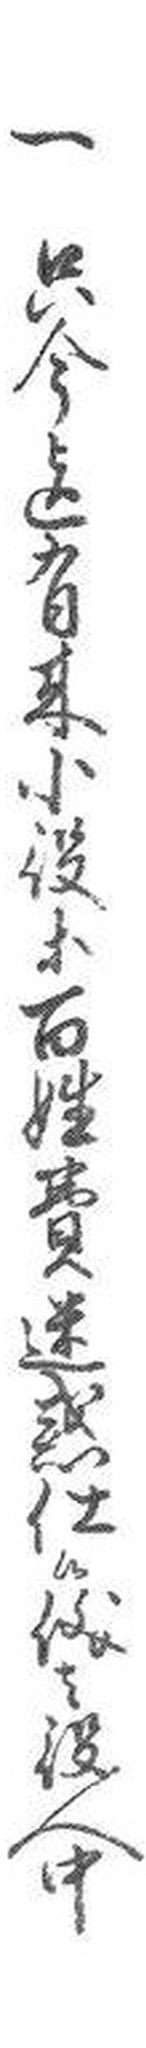一只今迄有来小役等百姓費迷惑仕候儀者役人中
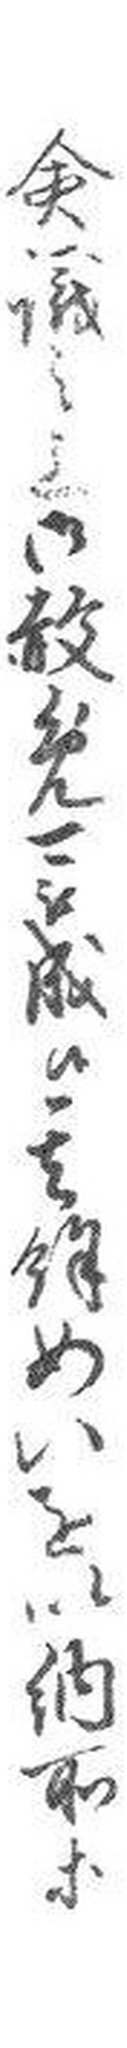僉議之上御赦免可被成候其余めいを以納所等
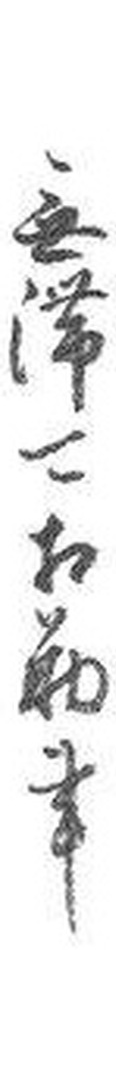無滞可相勤事
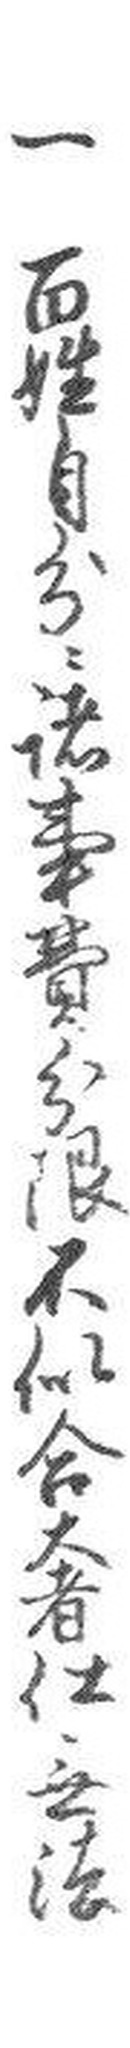一百姓自分ニ諸事費分限不似合奢仕無法
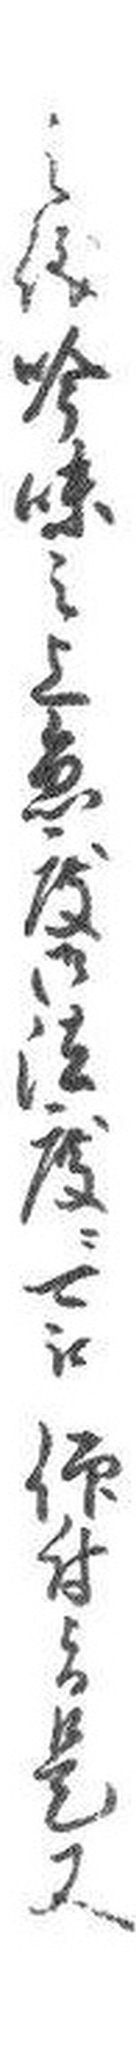之儀吟味之上急度御法度ニ可被仰付旨是又
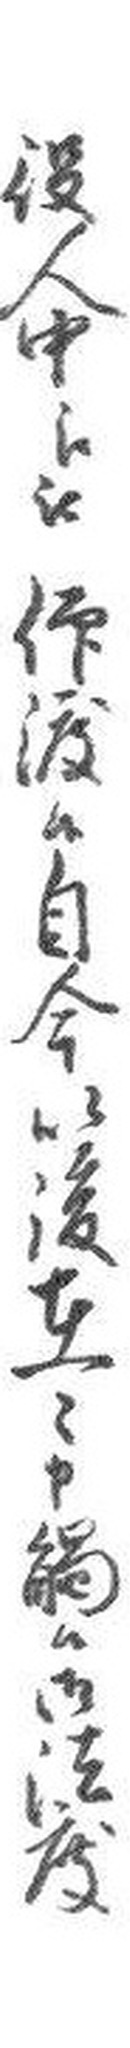役人中江被仰渡候自今以後在々申触候御法度
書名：家譜 七 光通公 従寛文四年到同九年
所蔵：福井県文書館 Fukui Prefectural Archives
